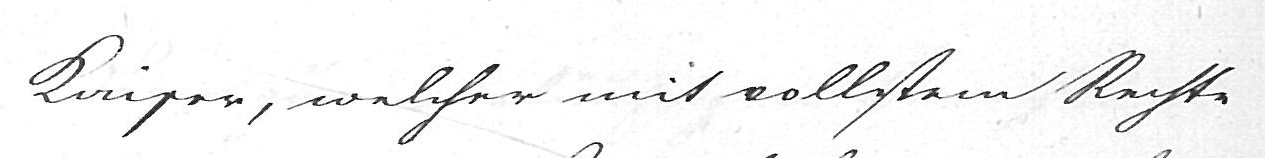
Kaiser, welcher mit vollsten Rechte
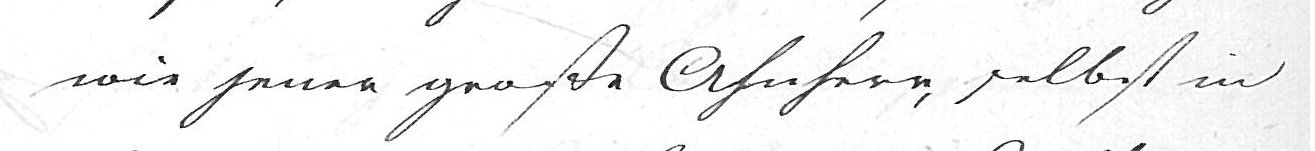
wie jener große Ahnherr, selbst in
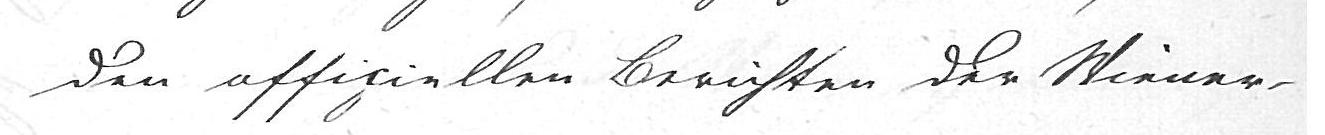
den officiellen Berichten der Wiener
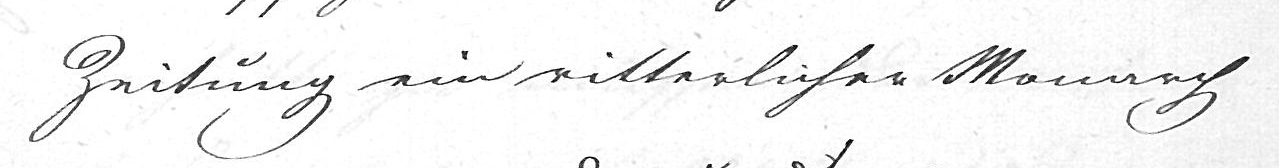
Zeitung ein ritterlicher Monarch
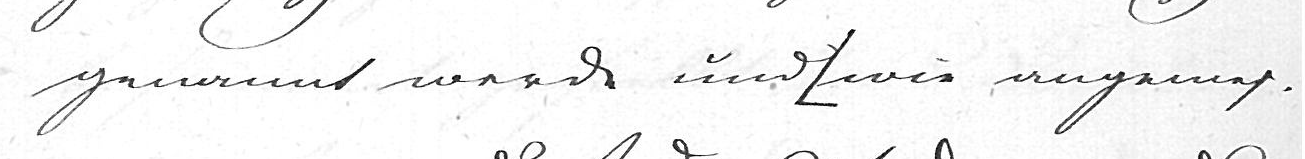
genannt werde und wie angemes-
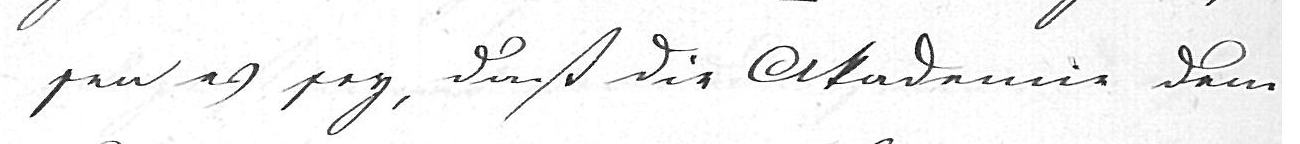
sen es sey, daß die Akademie dem
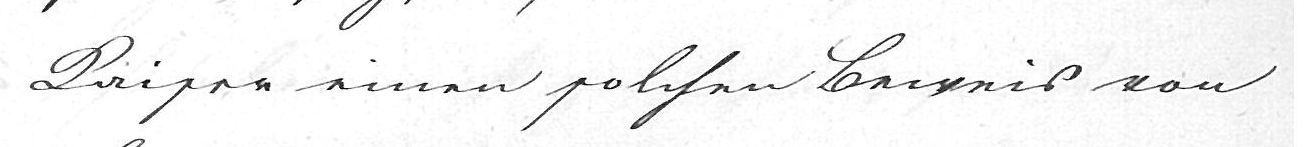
Kaiser einen solchen Beweise von
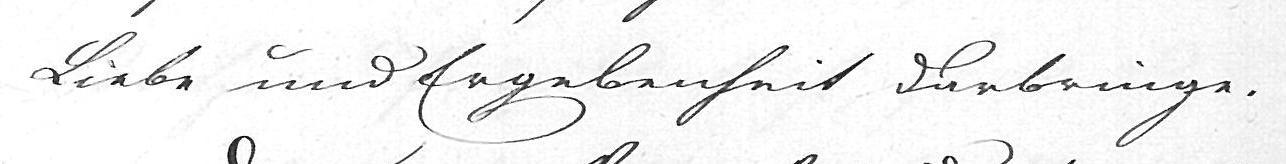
Liebe und Ergebenheit darbringe.
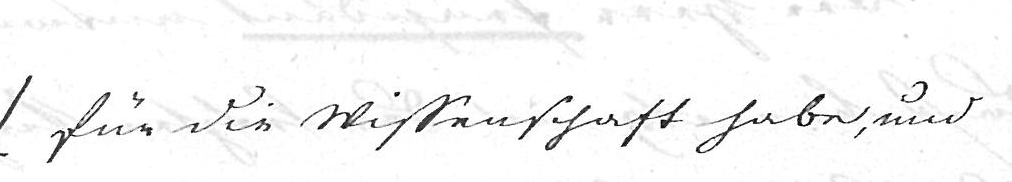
für die Wissenschaft habe, und
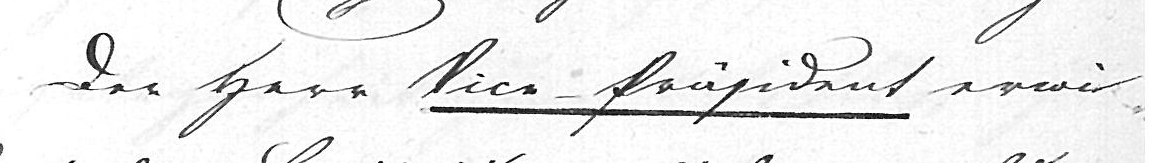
Der Herr Vice-Präsident erwi-
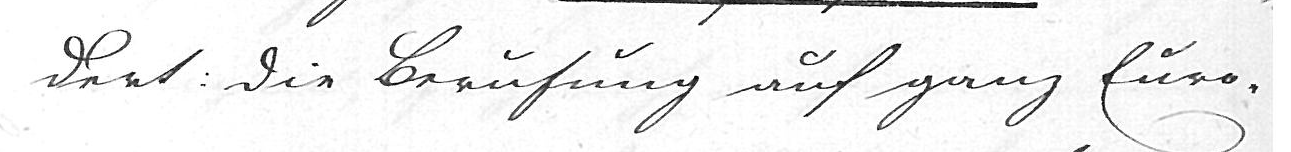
dert: Die Berufung auf ganz Euro-
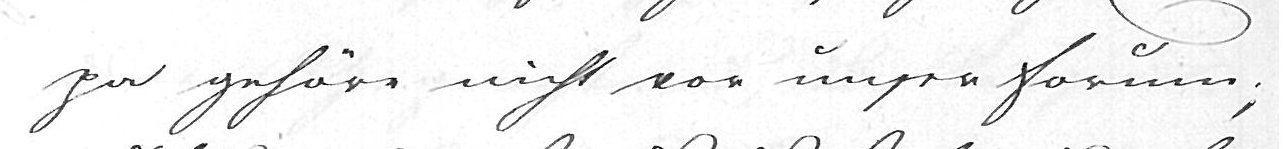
pa gehöre nicht vor unser Forum,
